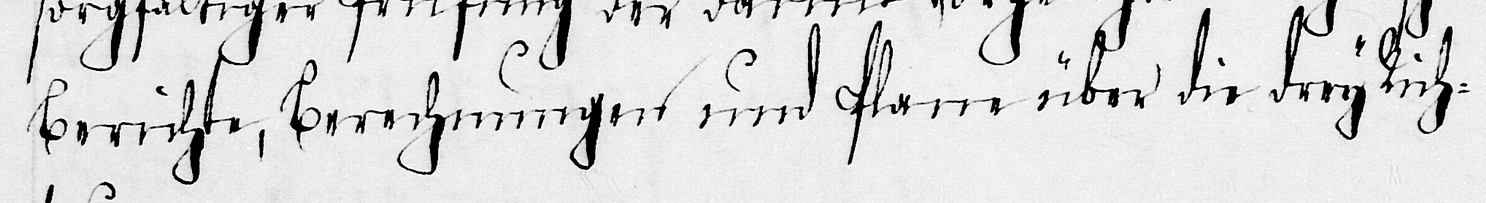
Berichte, Berechnungen und Plane über die drey Rich¬
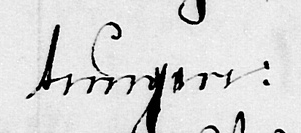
tungen:
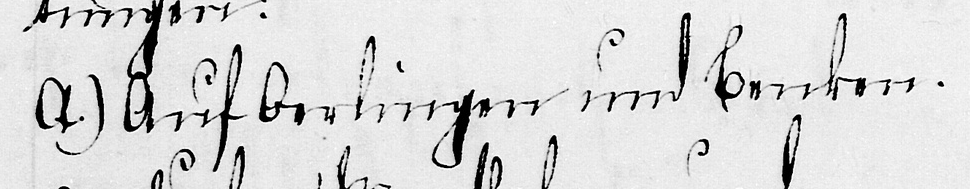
A.) Auf Oerlingen und Benken.
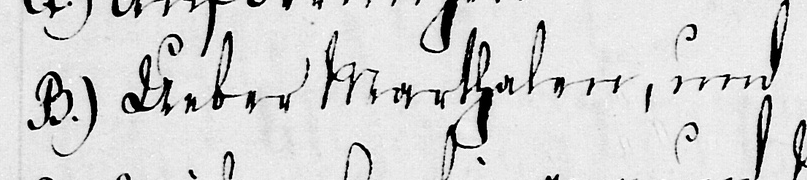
B.) Ueber Marthalen, und
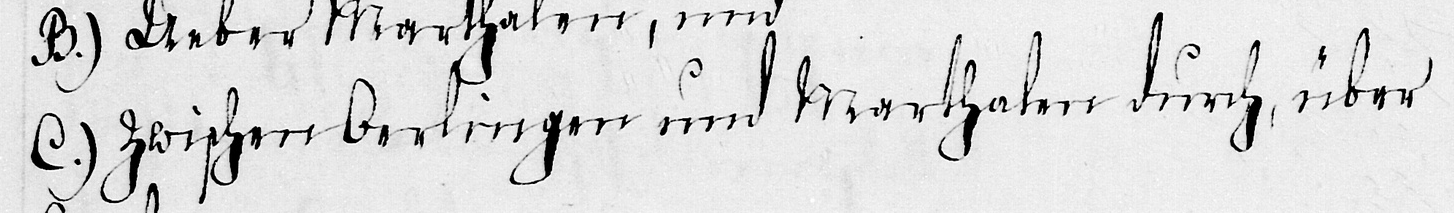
C.) Zwischen Oerlingen und Marthalen durch, über
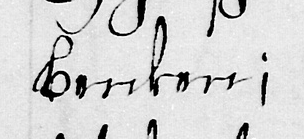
Benken;
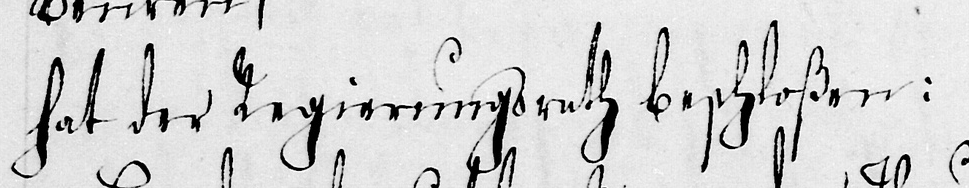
hat der Regierungsrath beschloßen:
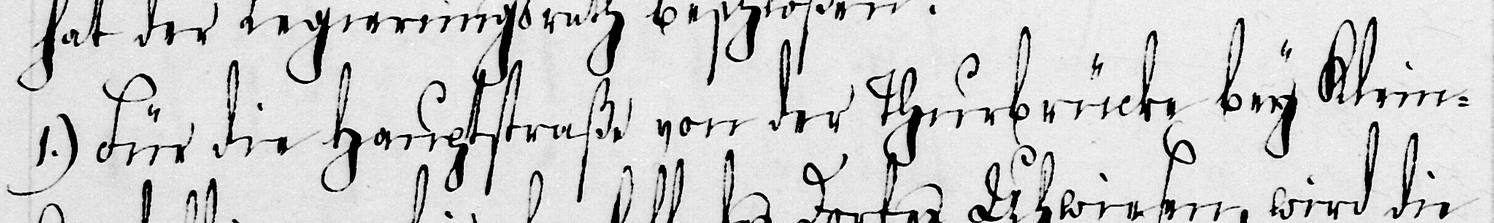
1.) Für die Hauptstraße von der Thurbrücke bey Klei¬
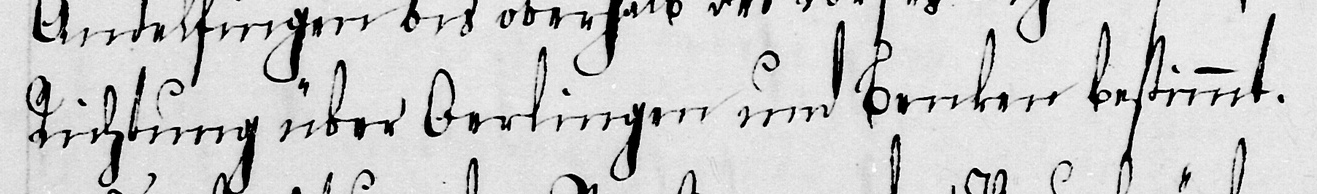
Richtung über Oerlingen und Benken bestimmt.
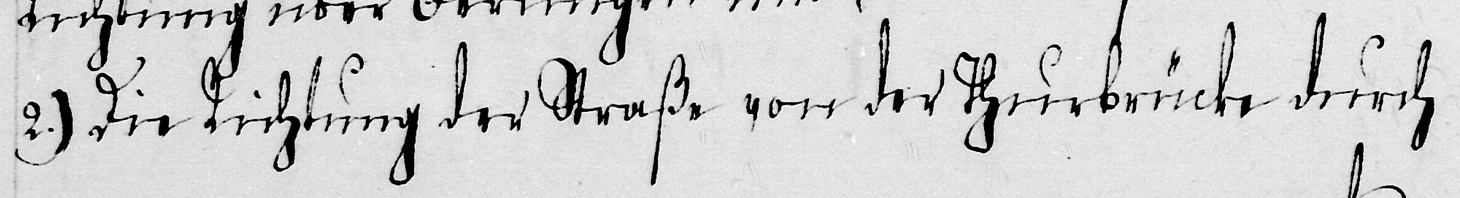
2.) Die Richtung der Straße von der Thurbrücke durch
